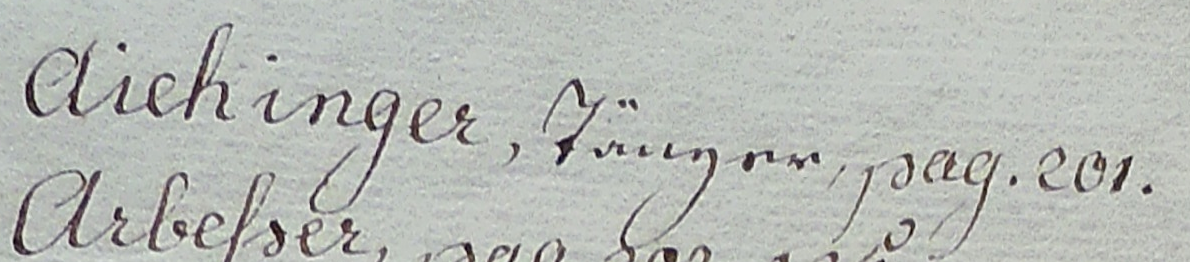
Aichinger, Tänzer, pag. 201.
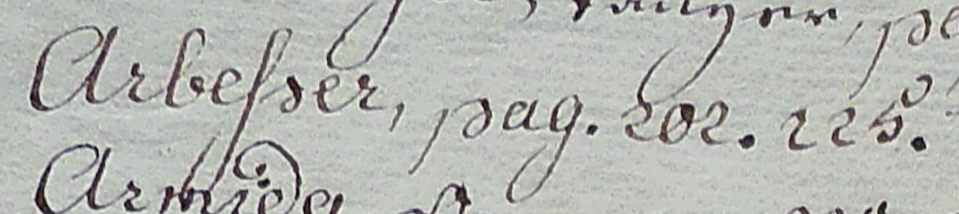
Arbesser, pag. 202. 225.
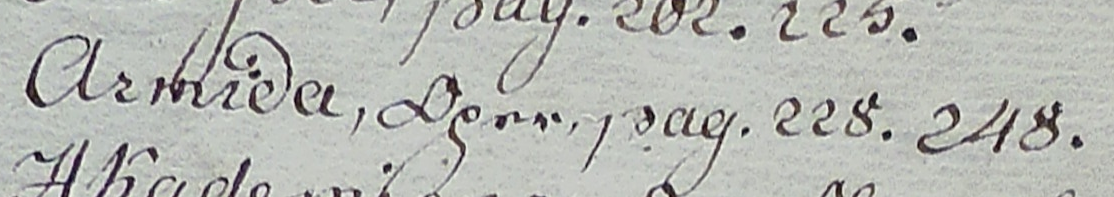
Armida, Oper, pag 228. 248.
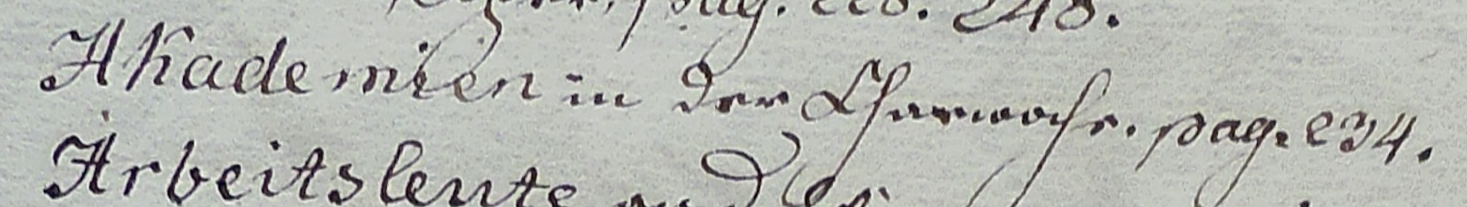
Akademien in der Charwoche. pag. 234.
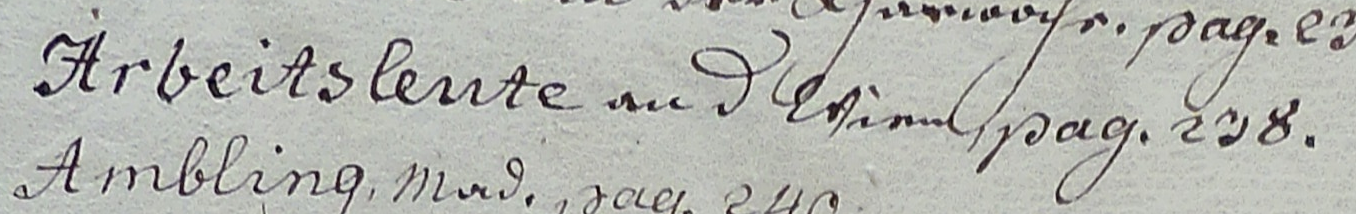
Arbeitsleute an d Wien, pag. 238.
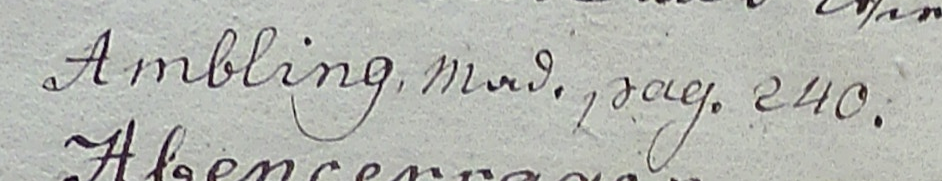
Ambling, Mad. pag. 240.
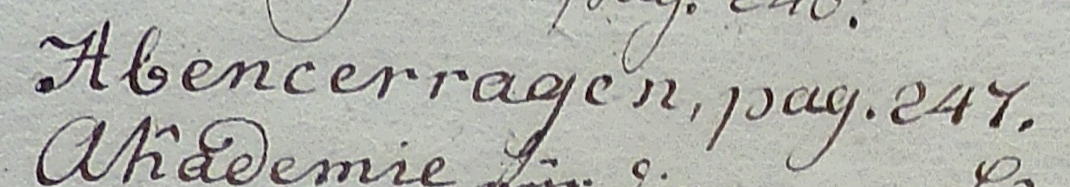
Abencerragen, pag. 247.
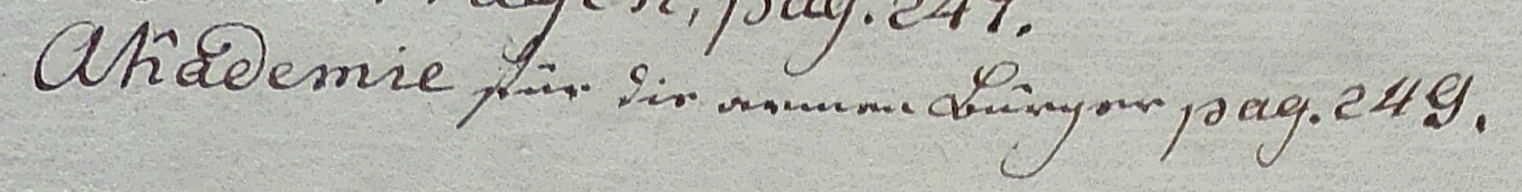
Akademie für die armen Bürger pag. 249.
